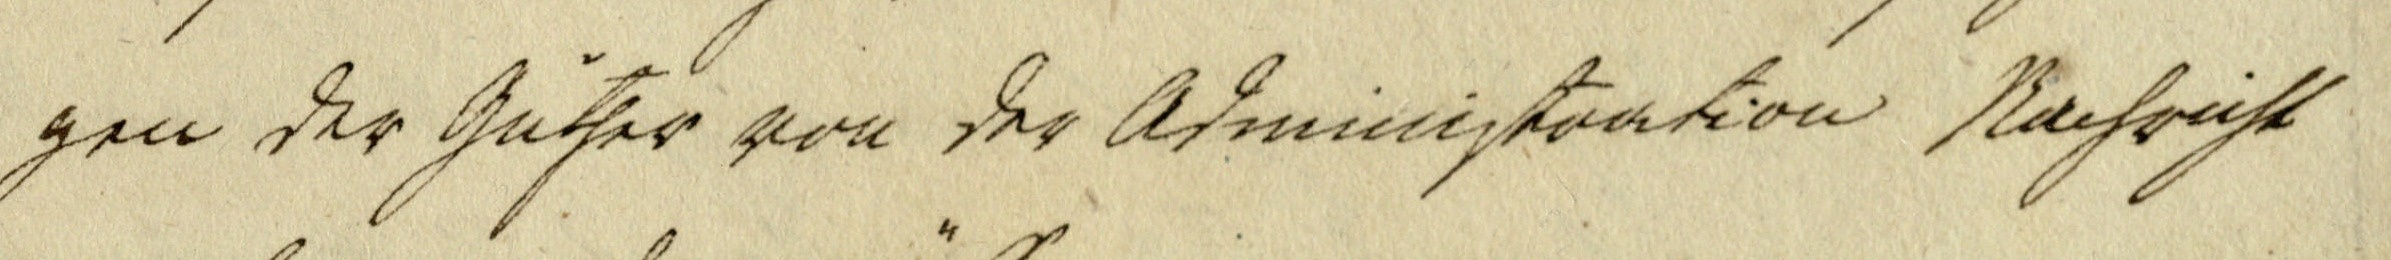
gen der Güther von der Administration Nachricht
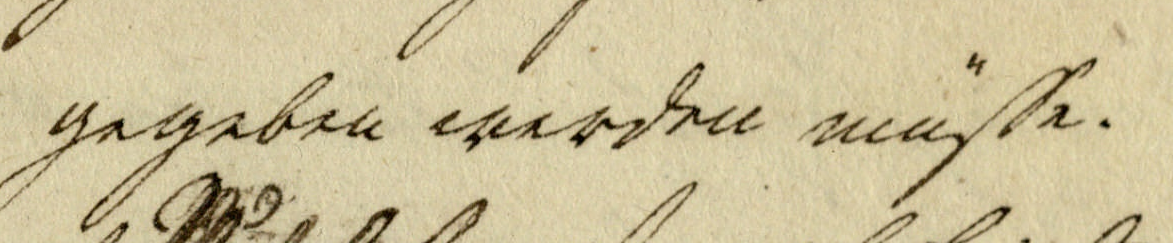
gegeben werden müsse.
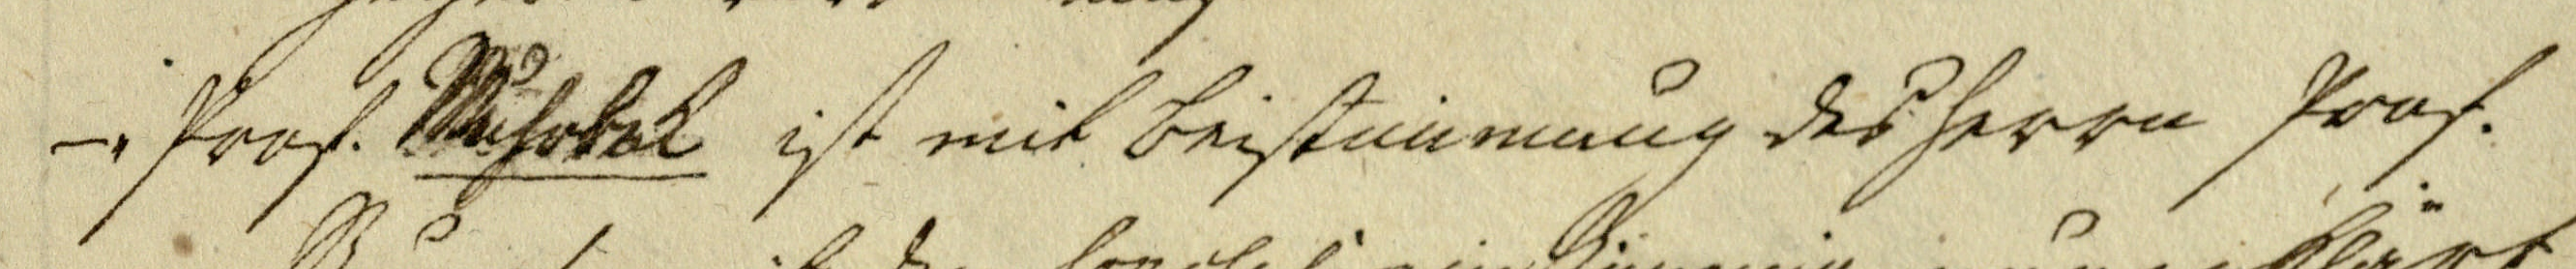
Prof. Muhrbeck ist mit Beistimmung des Herrn Prof.
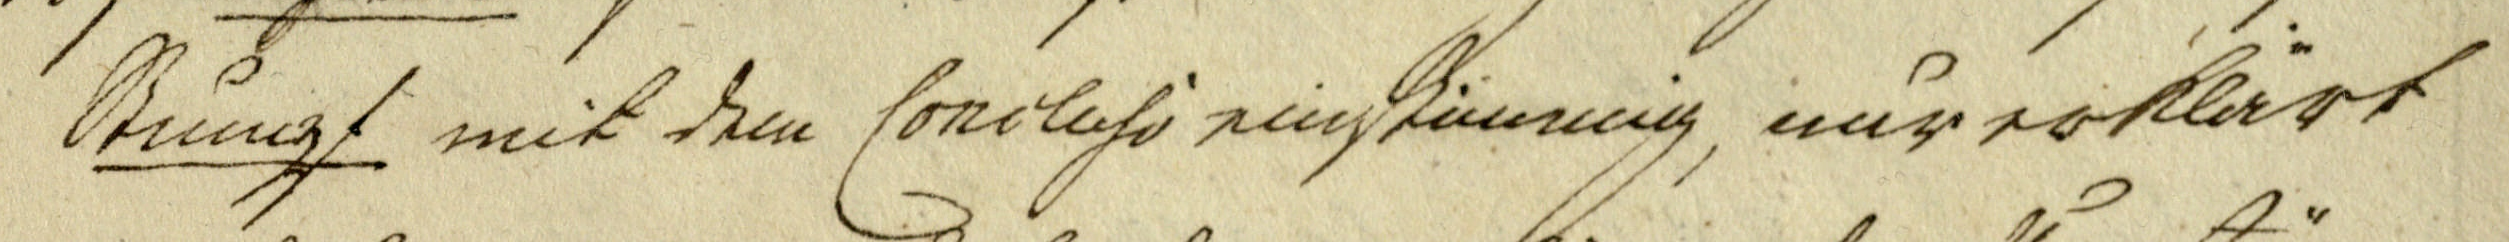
Stumpf mit dem Concluso einstimmig, nur erklärt
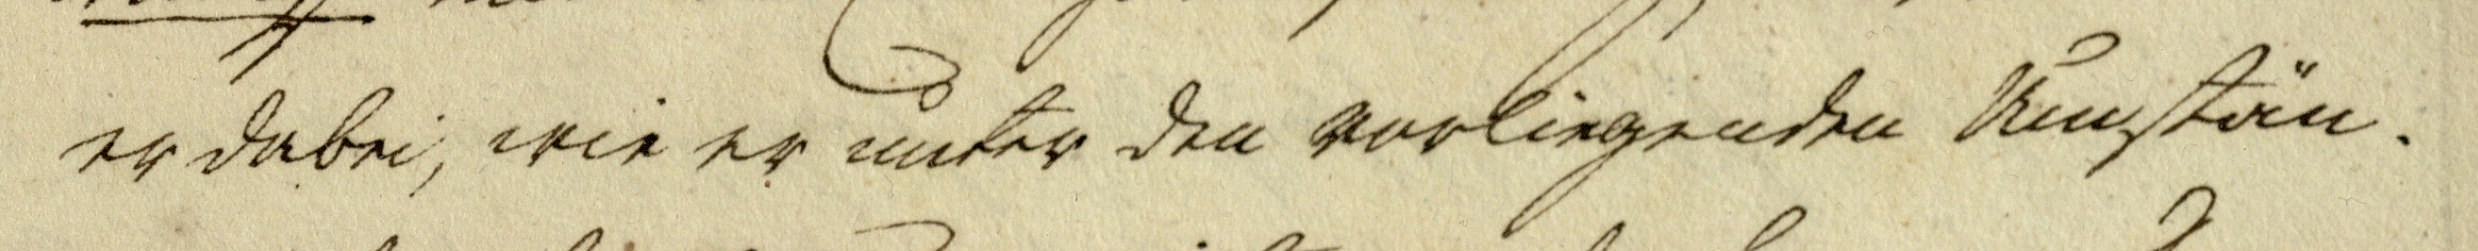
er dabei, wie er unter den vorliegenden Umstän¬
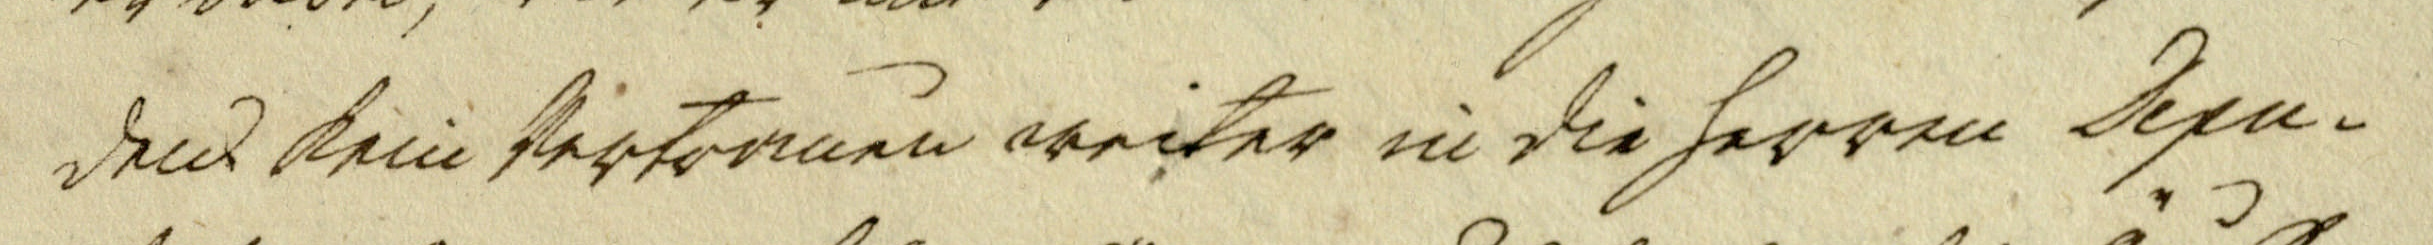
den kein Vertrauen weiter in die Herren Depu¬
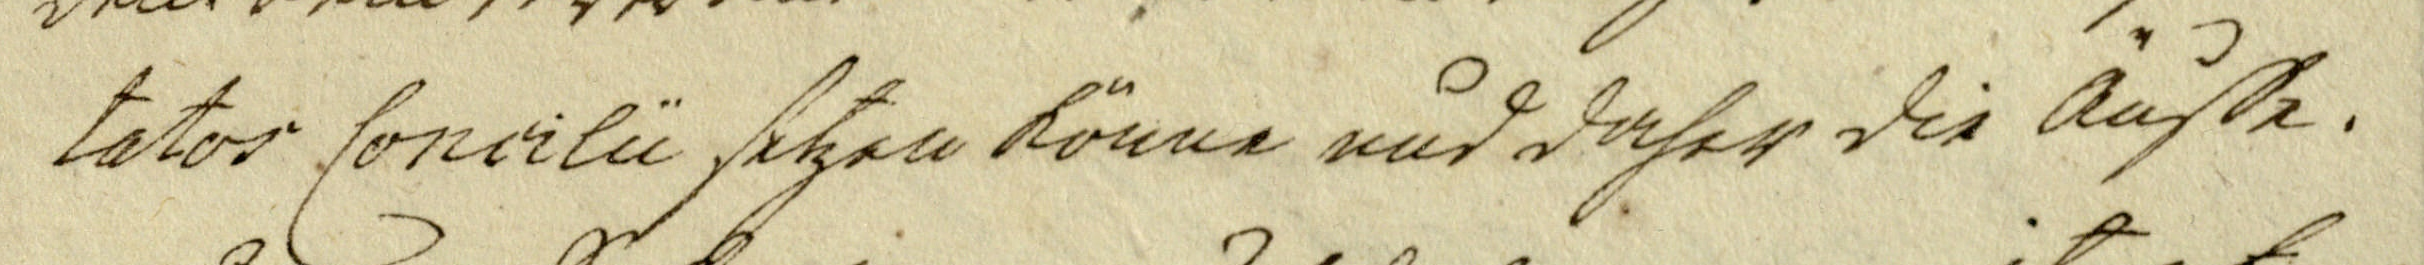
tatos Concilii setzen könne und daher die Äusse¬
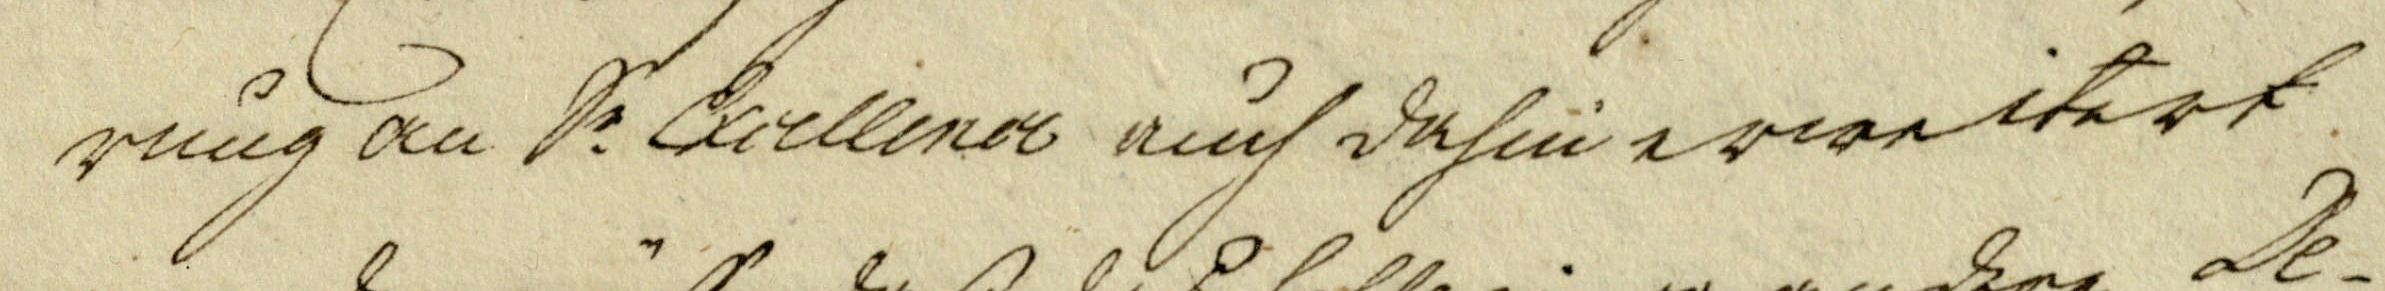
rung an Sr Excellence auch dahin erweitert
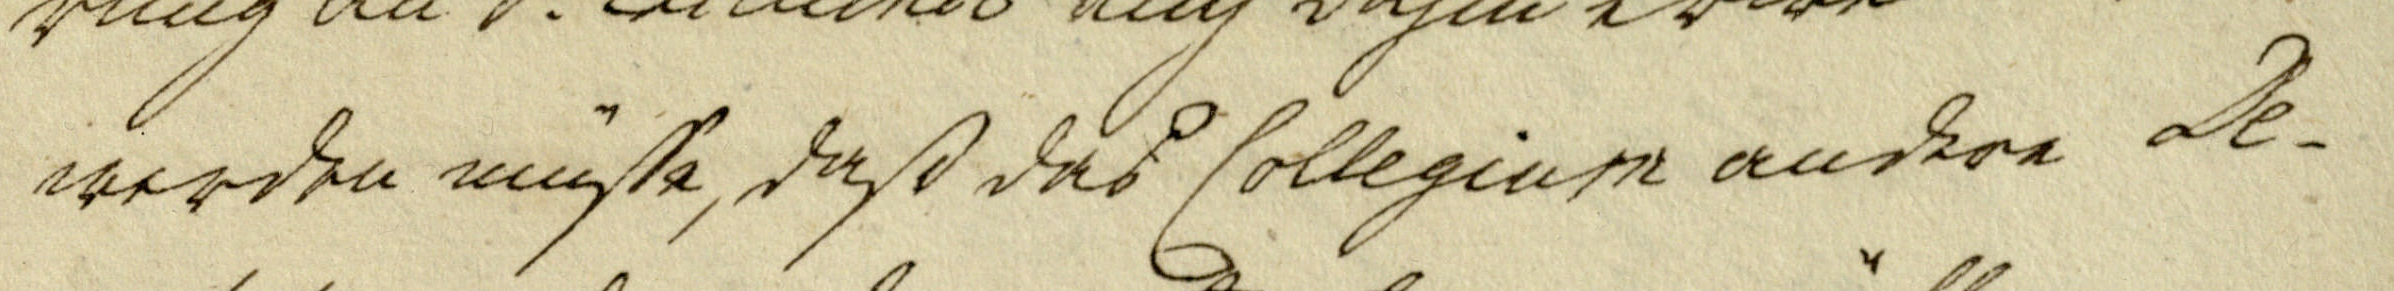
werden müsse, daß das Collegium andere De¬
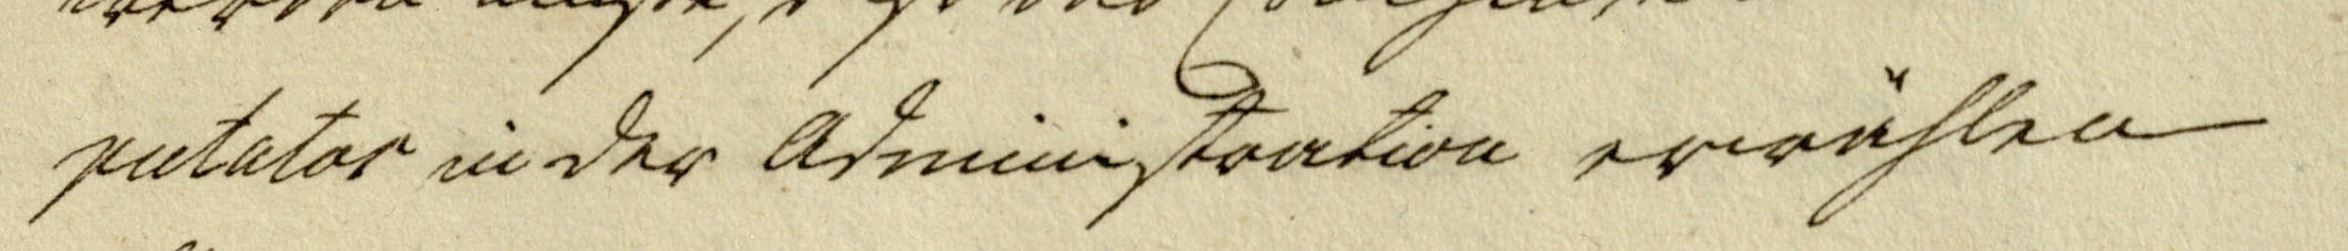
putatos in der Administration erwählen
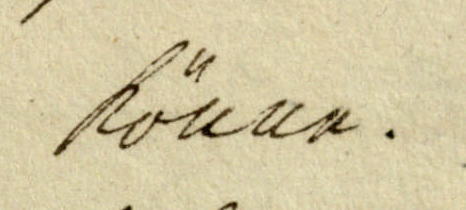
könne.
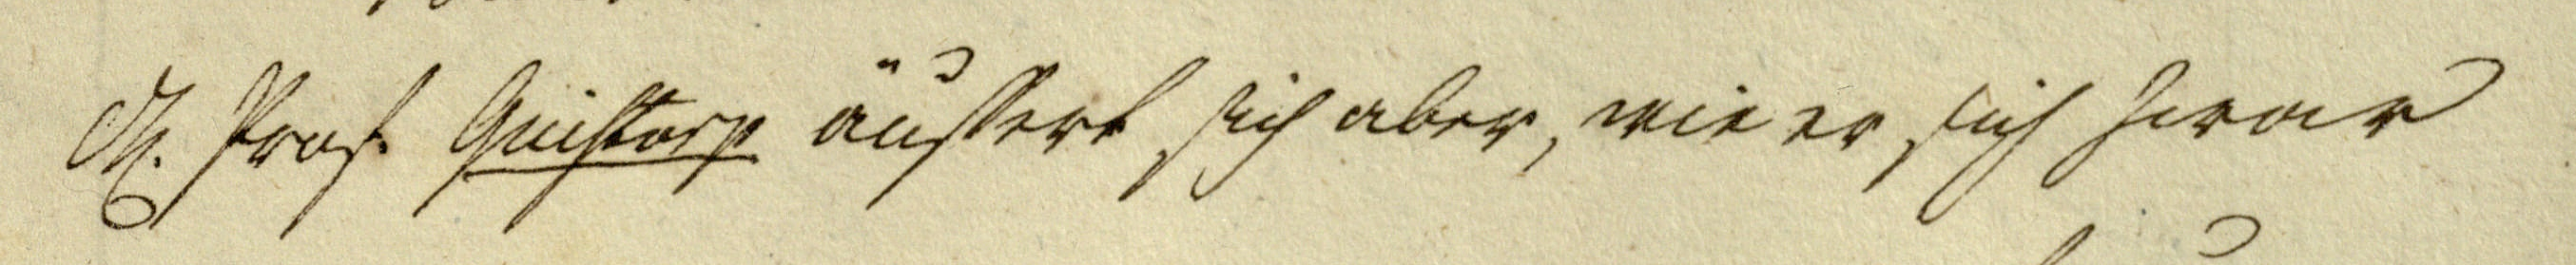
dh. Prof. Quistorp äussert sich aber, wie er sich zwar
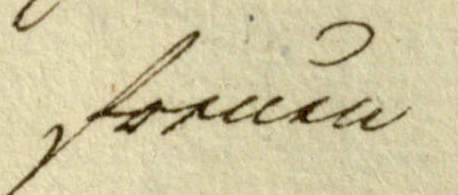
freuen
